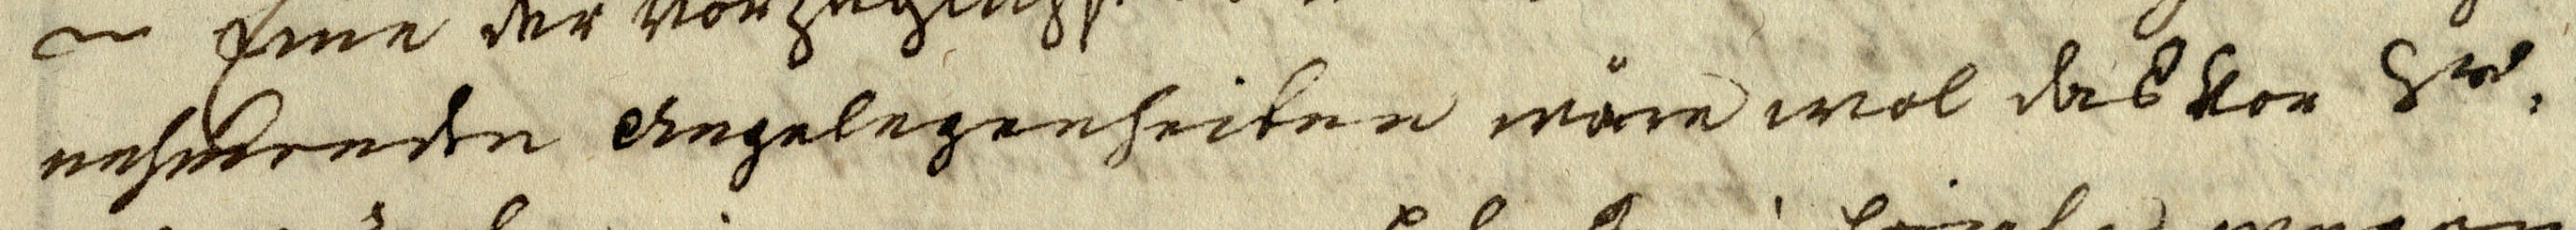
nehmende Angelegenheiten wäre wol das von Sr.
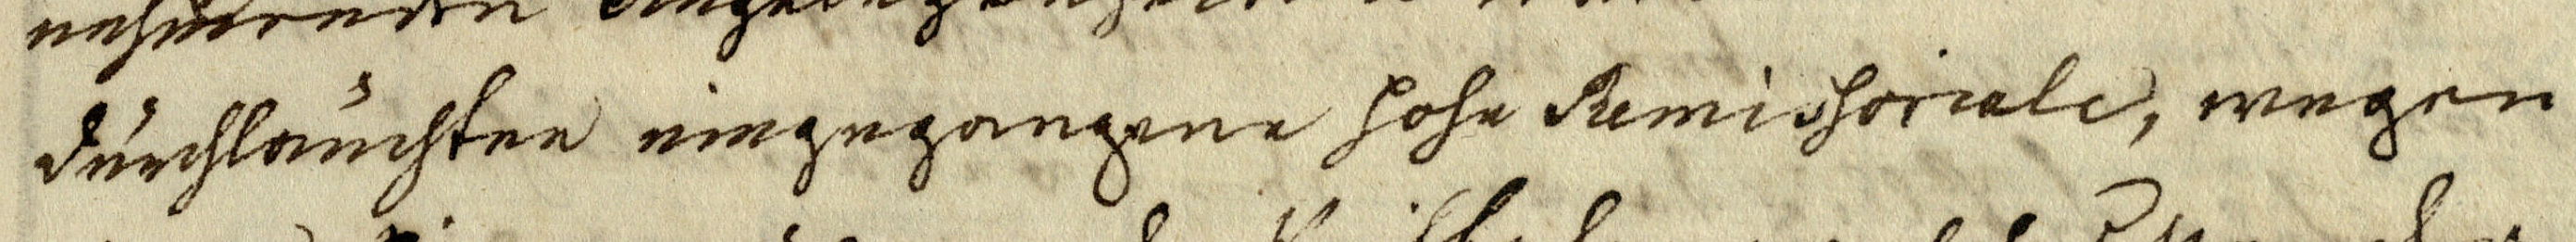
Durchlauchten eingegangene hohe Remissoriale, wegen
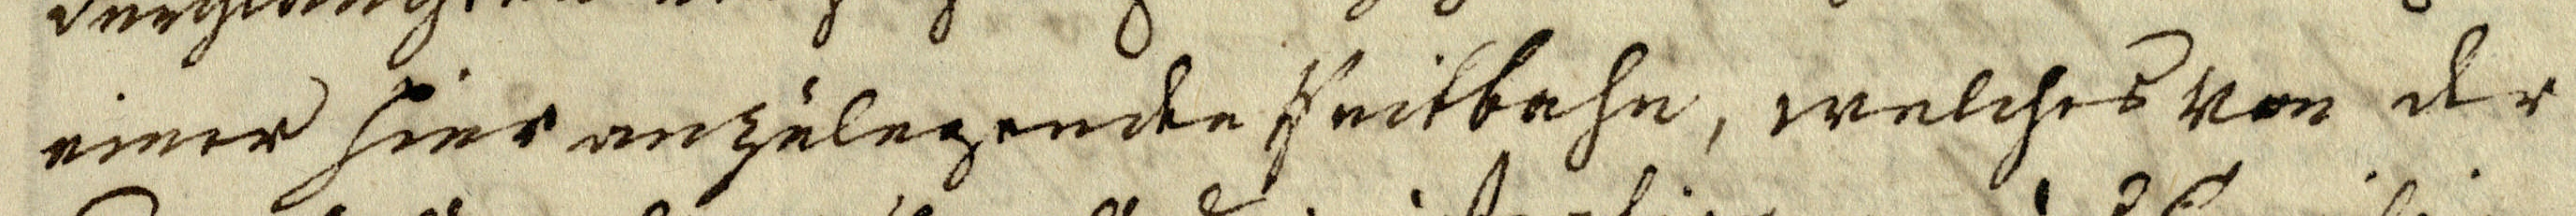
einer hier anzulegenden Reitbahn, welche von der
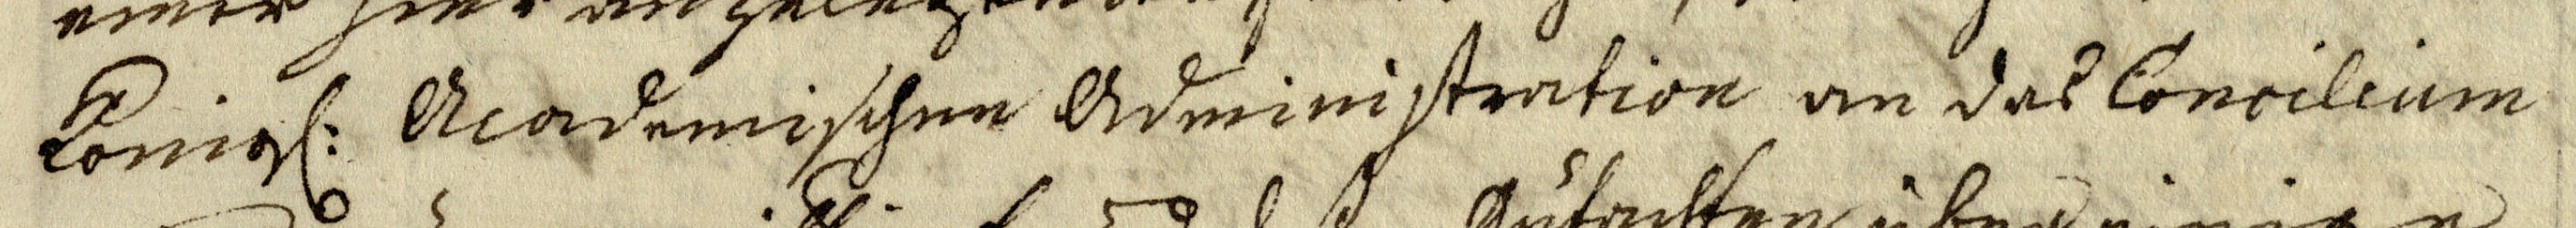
Königl. Academischen Administration an das Concilium
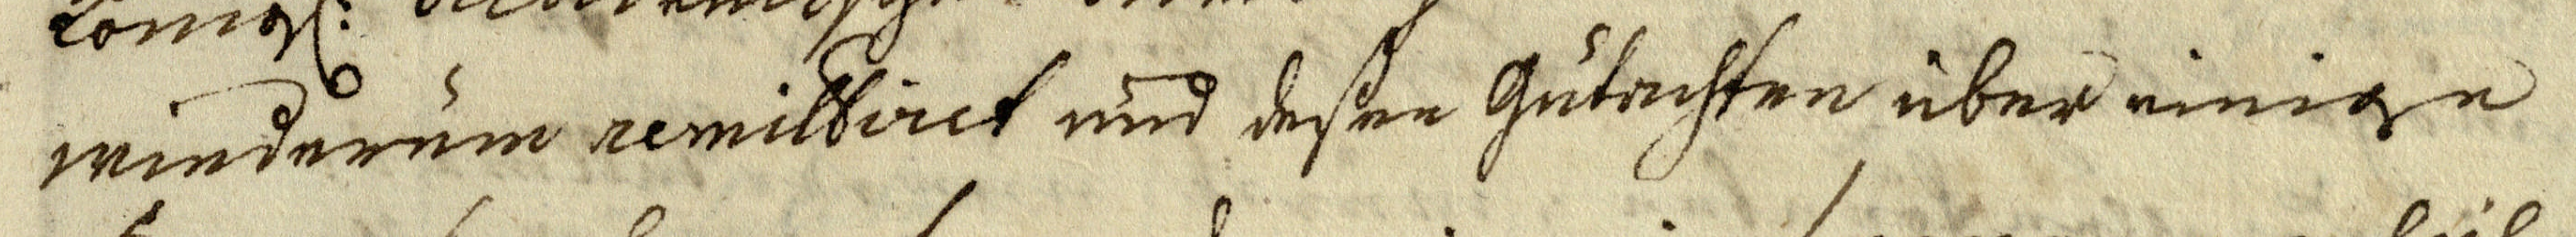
wiederum remittiret und dessen Gutachten über einige
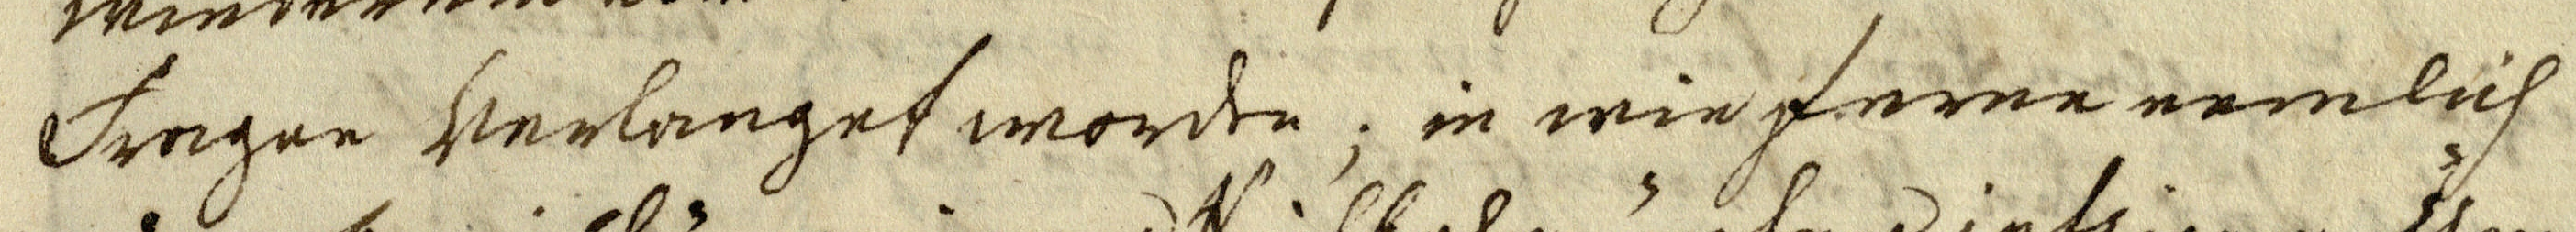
Fragen verlanget worden; in wie ferne nemlich
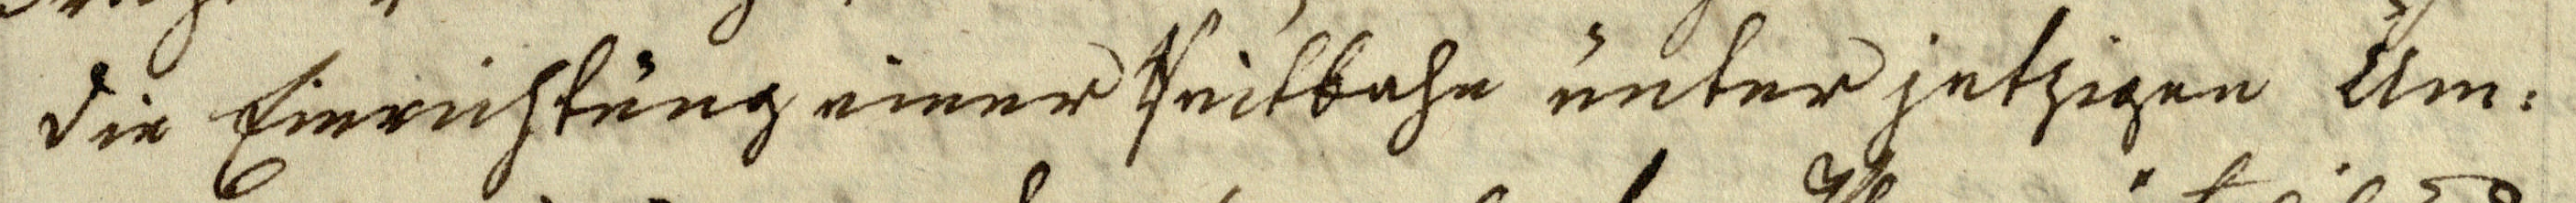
die Einrichtung einer Reitbahn unter jetzigen Um¬
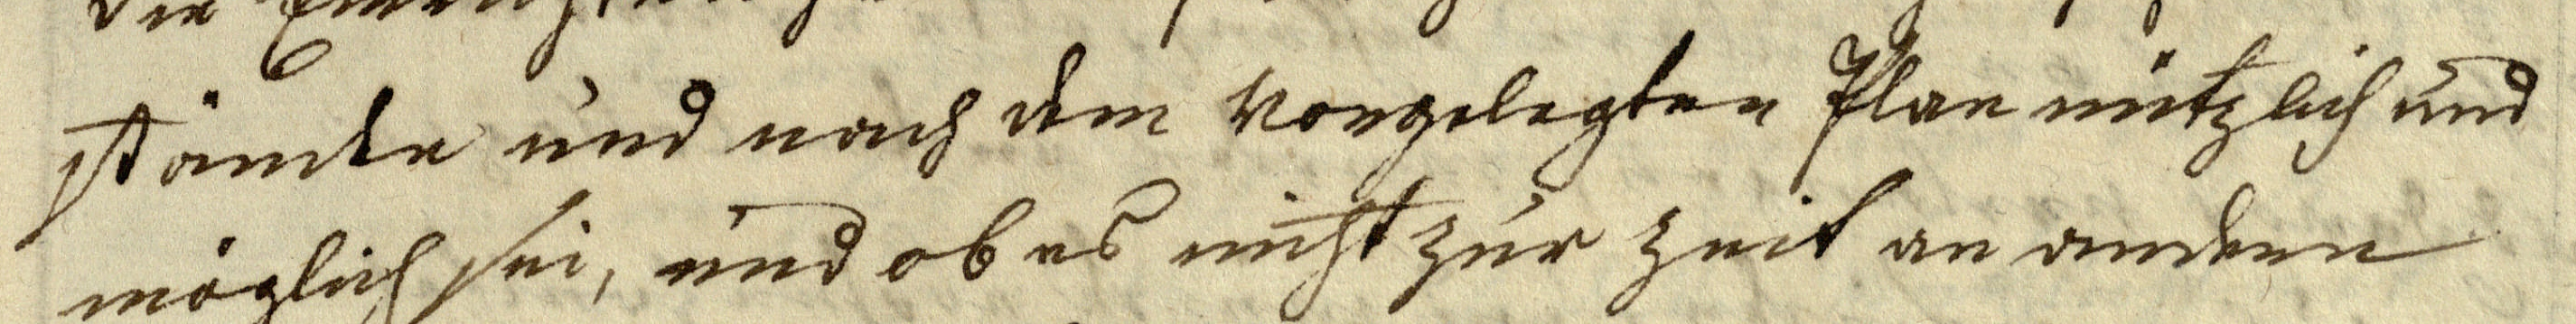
ständen und nach dem vorgelegten Plan nützlich und
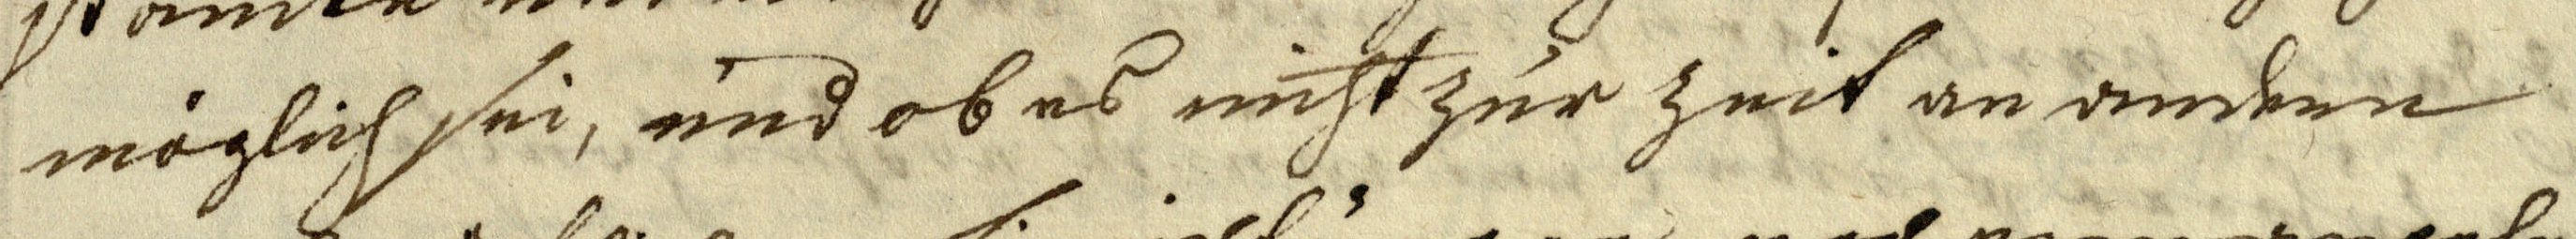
möglich sei, und ob es nicht zur zeit an andere
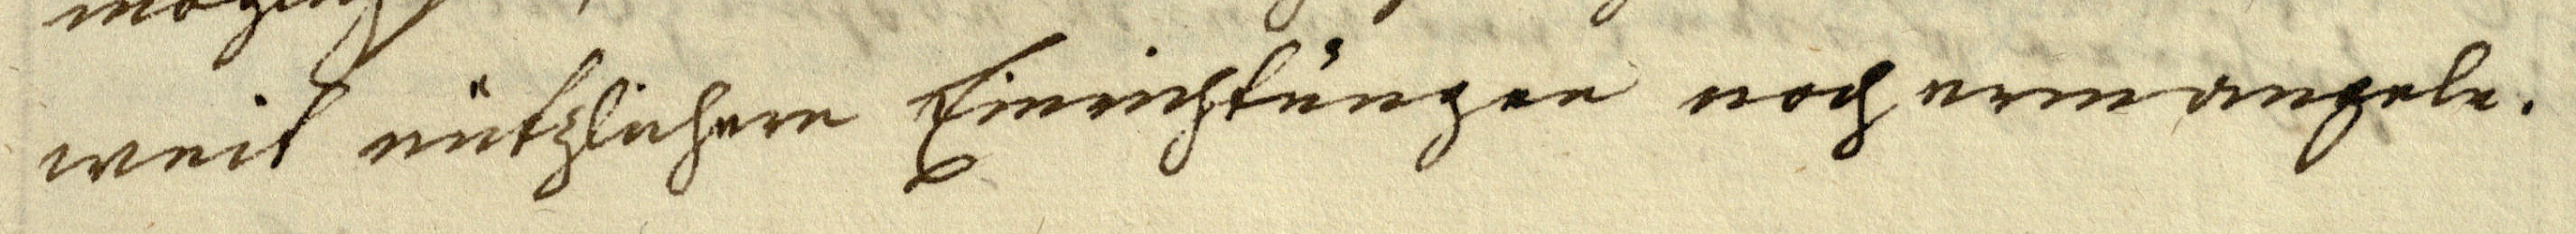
weit nützlichere Einrichtungen noch ermangele.
